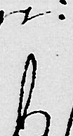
1.)
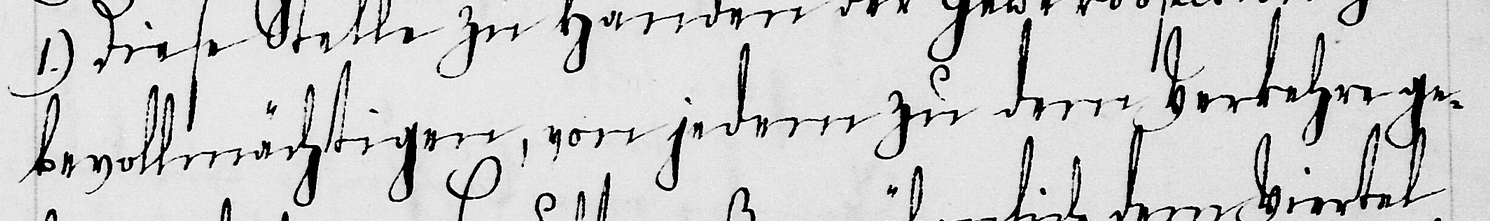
bevollmächtigen, von jedem zu dem Verkehre ge¬
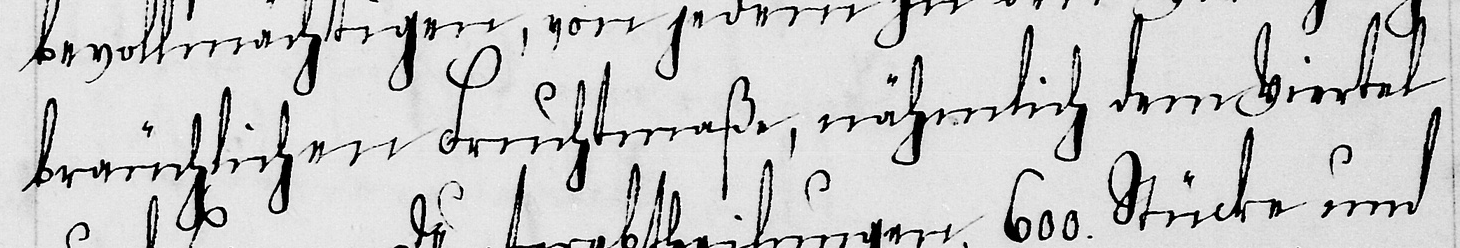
bräuchlichen Fruchtmaße, nähmlich dem Viertel
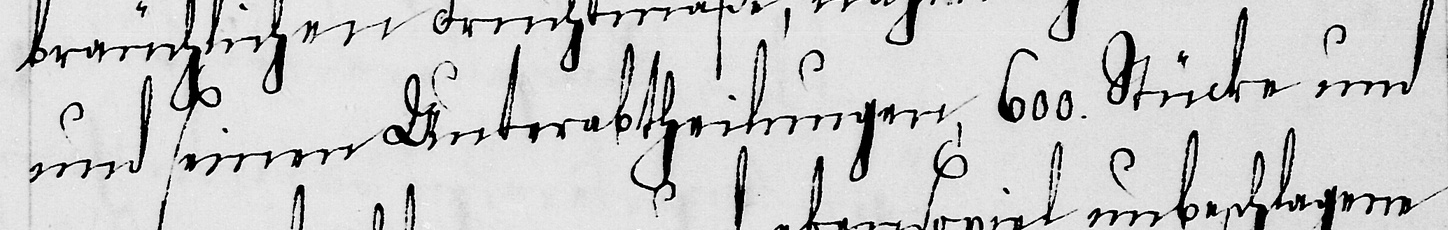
und seinen Unterabtheilungen, 600. Stücke und
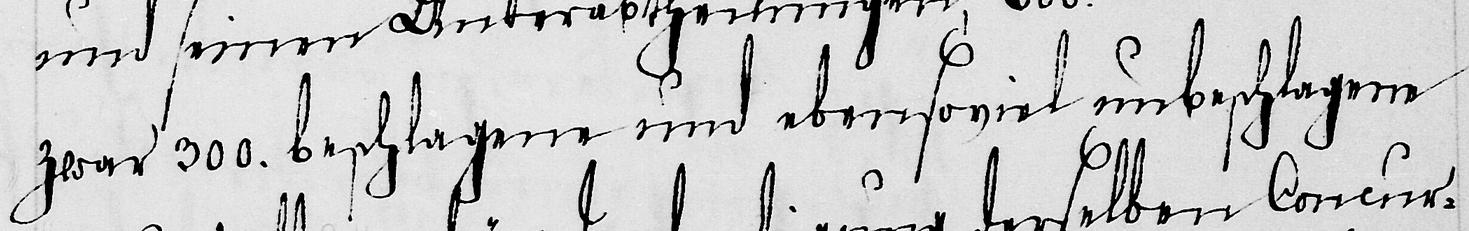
zwar 300. beschlagene und ebensoviel unbeschlagene
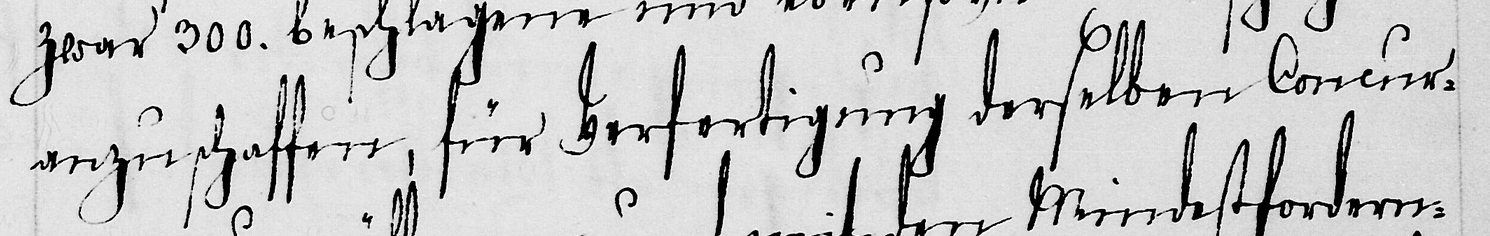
anzuschaffen, für Verfertigung derselben Concur¬
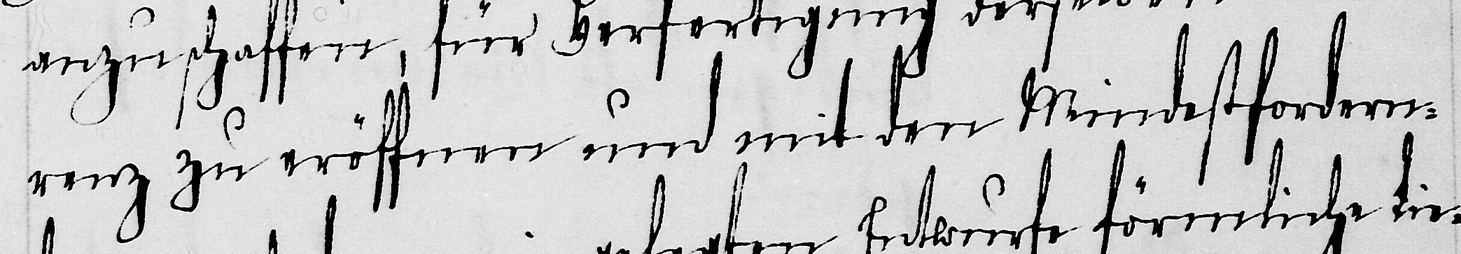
renz zu eröffnen und mit den Mindestfordern¬
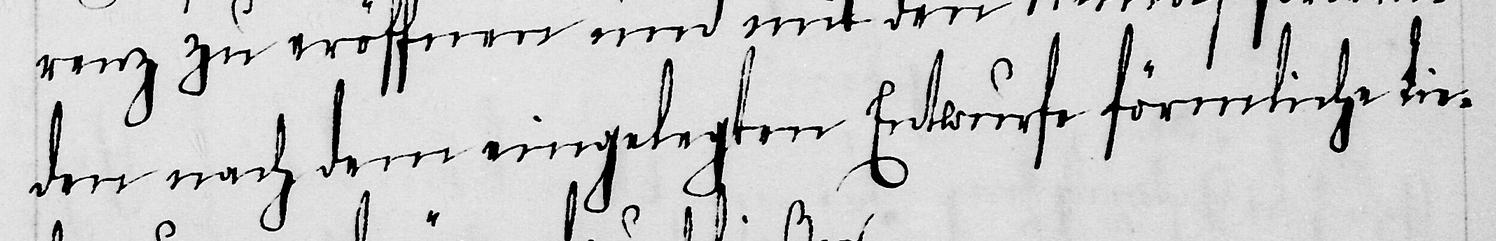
den nach dem eingelegten Entwurfe förmliche Lie¬
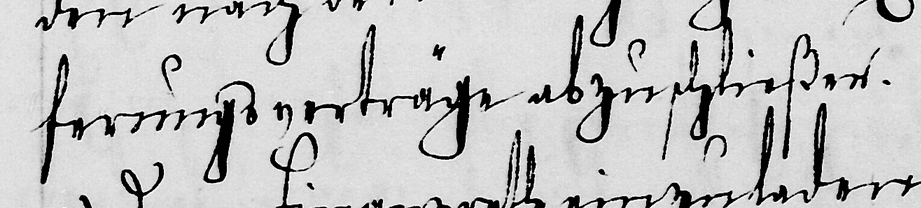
ferungsverträge abzuschließen.
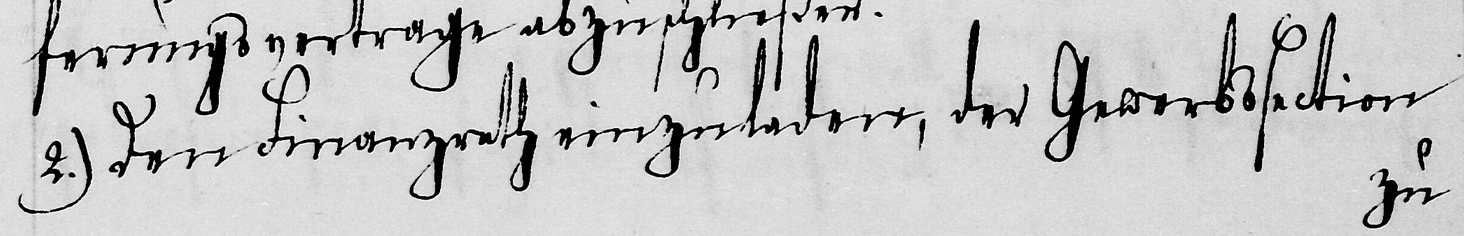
2.) Den Finanzrath einzuladen, der Gewerbssection
